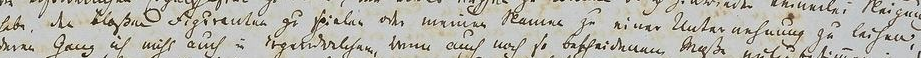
habe, den bloßen Figuranten zu spielen oder meinen Namen zu einer Unternehmung zu leihen,
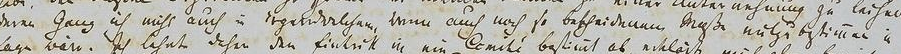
deren Gang ich nicht auch in irgendwelchem, wenn auch noch so bescheidenem Maße mitzubestimmen in
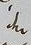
der
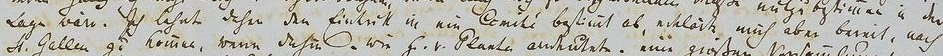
Lage wäre. Ich lehnte daher den Eintritt in ein Comité bestimmt ab, erklärte mich aber bereit, nach
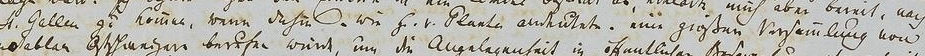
St.Gallen zu kommen, wenn dahin, wie Hr. v. Planta andeutete, eine größre Versammlung von
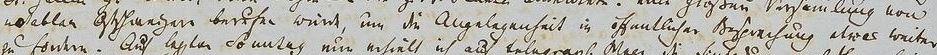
notablen Ostschweizern berufen würde, um die Angelegenheit in öffentlicher Besprechung etwas weiter
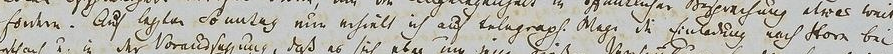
fördern. Auf letzten Sonntag nun erhielt ich auf telegraph. Wege die Einladung nach Horn bei
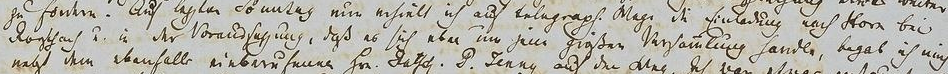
Rorschach & in der Voraussetzung, daß es sich eben um jene größre Versammlung handle, begab ich mich
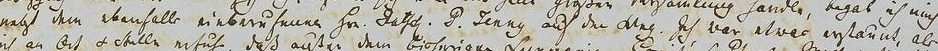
nebst dem ebenfalls einberufenen Hrn Rathsh. P. Jenny auf den Weg. Ich war etwas erstaunt, als
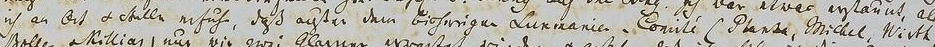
ich an Ort & Stelle erfuhr, daß außer dem bisherigen Lukmanier-Comité (Planta, Michel, Wirth,
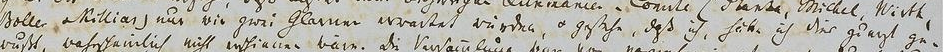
Boller, Killias ) nur wir zwei Glarner erwartet wurden,& gestehe, daß ich, hätte ich das zuerst ge-
